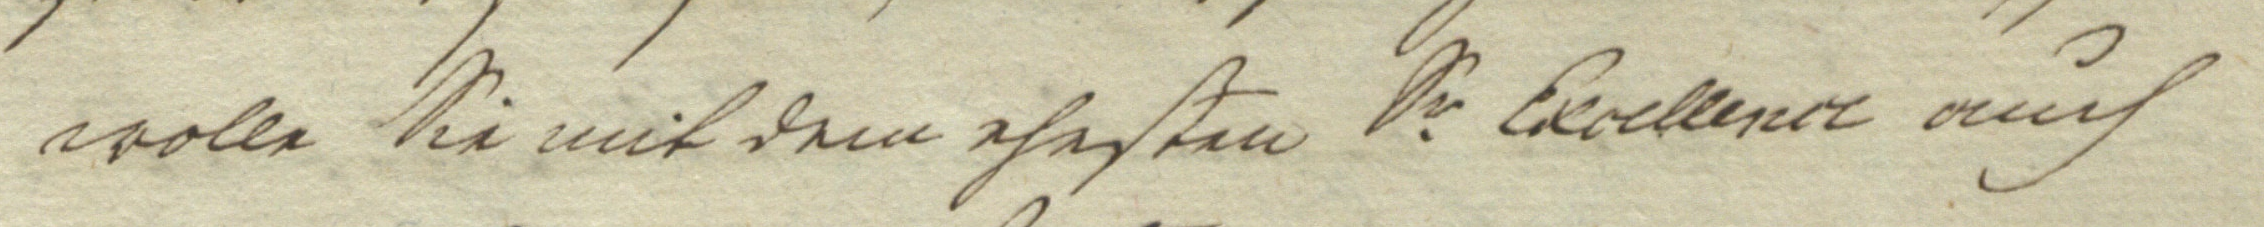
wolle Sie mit dem ehesten Sr Excellence auch
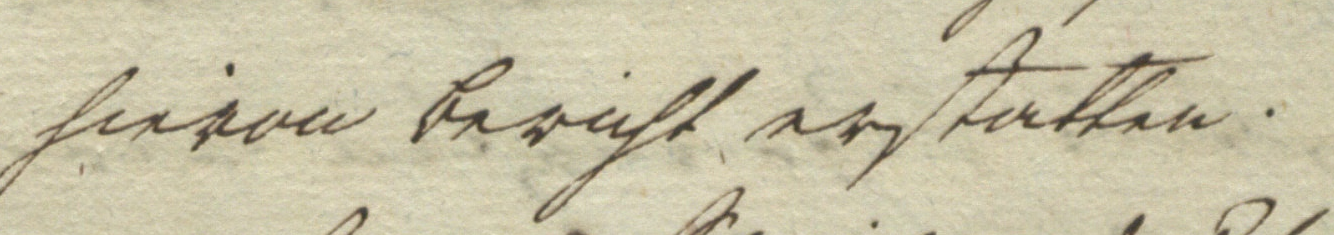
hievon Bericht erstatten.
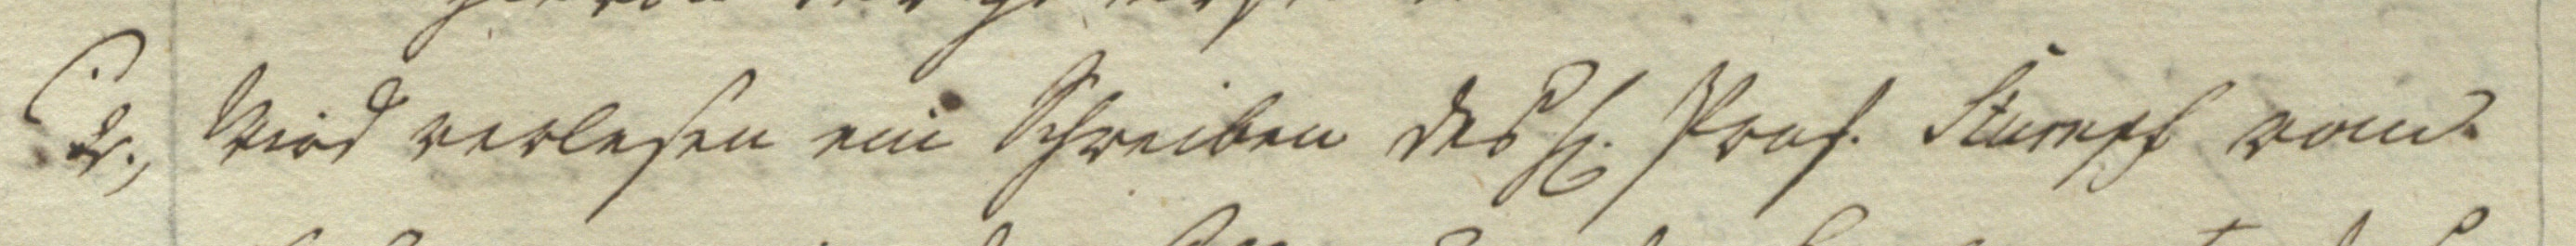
2., Wird verlesen ein Schreiben des H. Prof. Stumpf vom
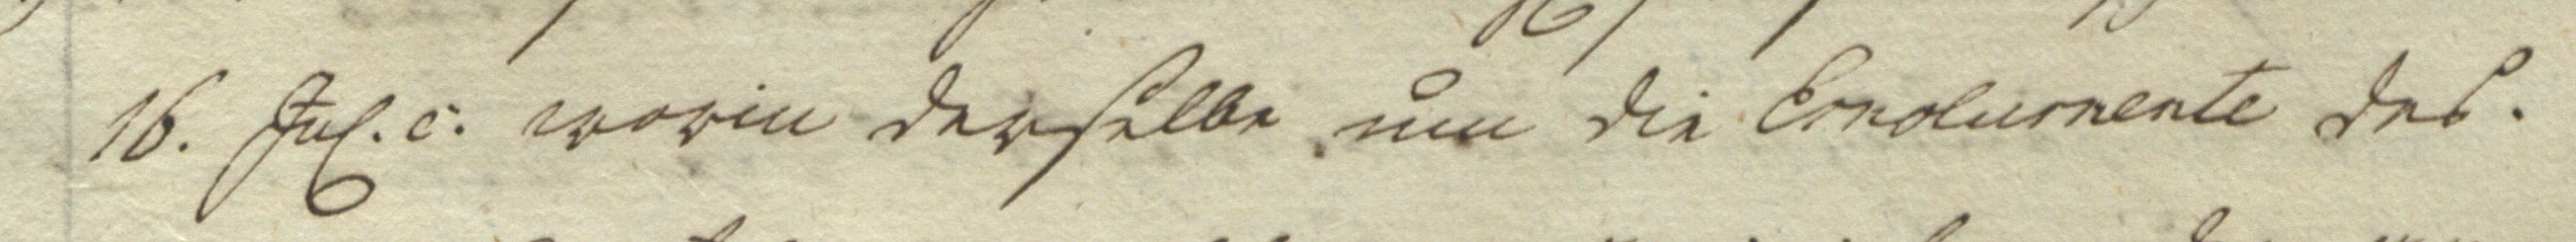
16. Jul. c. worin derselbe um die Emolumente des¬
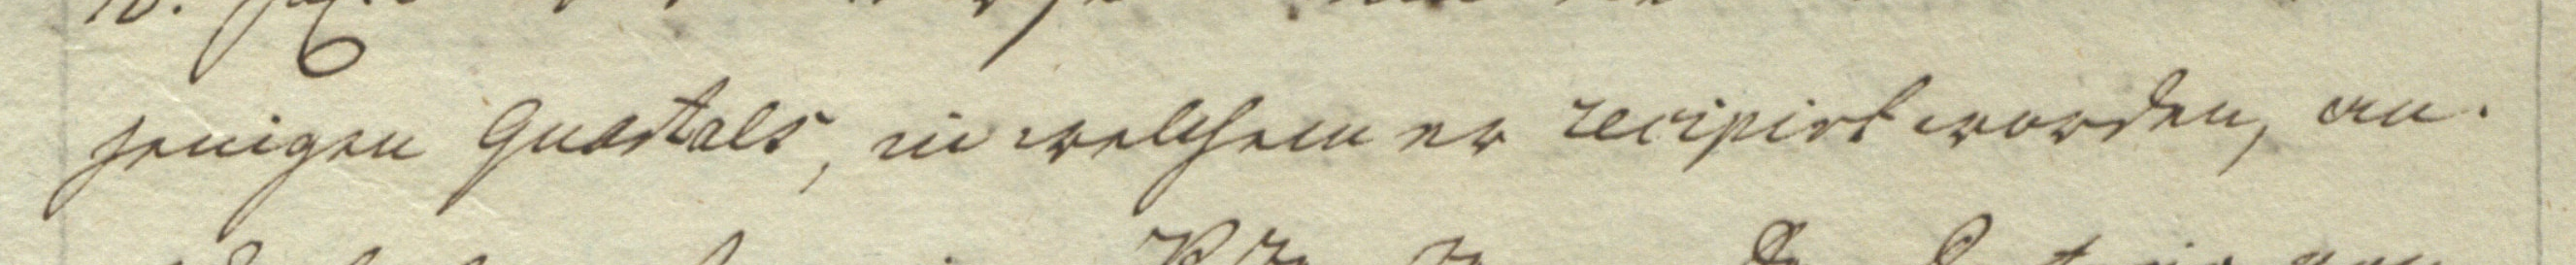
jenigen Quartals, in welchem er recipirt worden, an¬
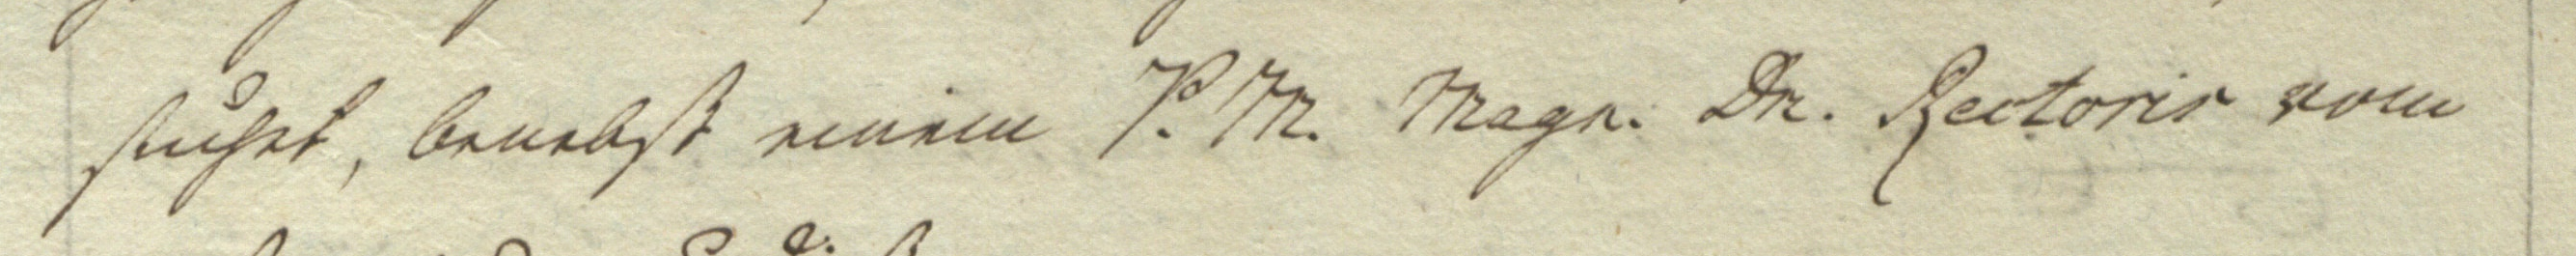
suchet, benebst einem P. M. Magn. Dn. Rectoris vom
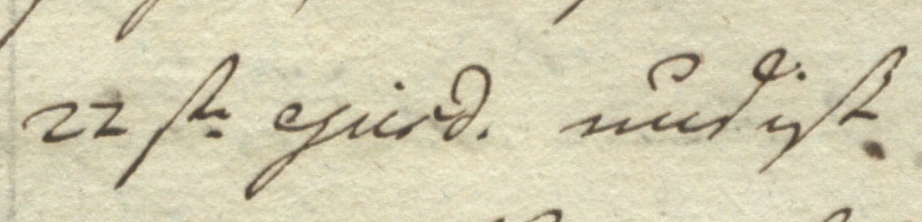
22 st ejusd. und ist
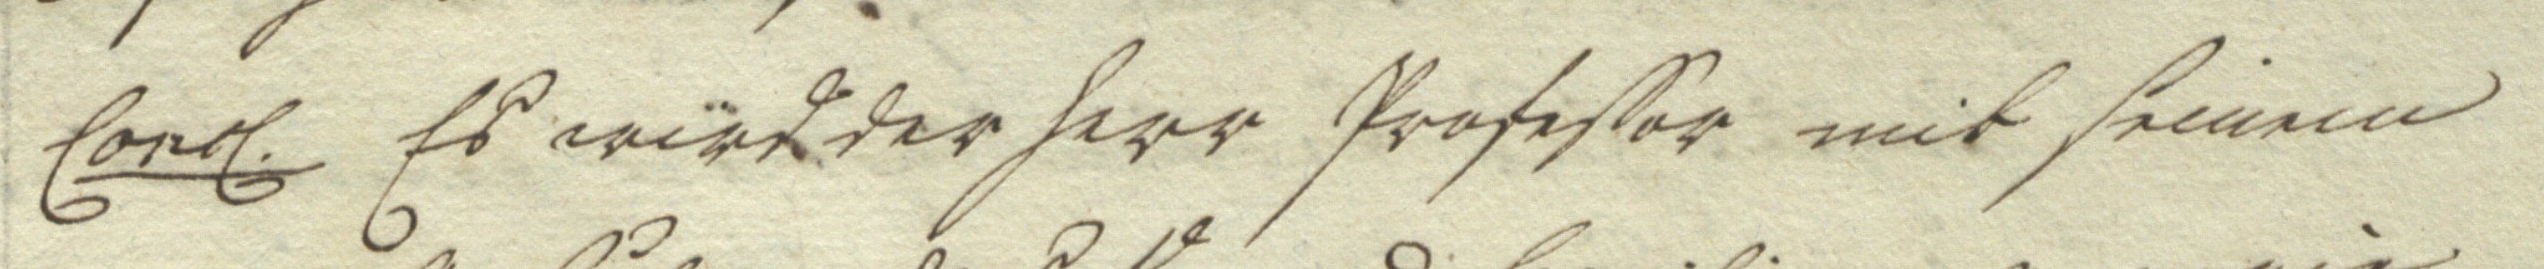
Concl. Es wird der Herr Professor mit seinem
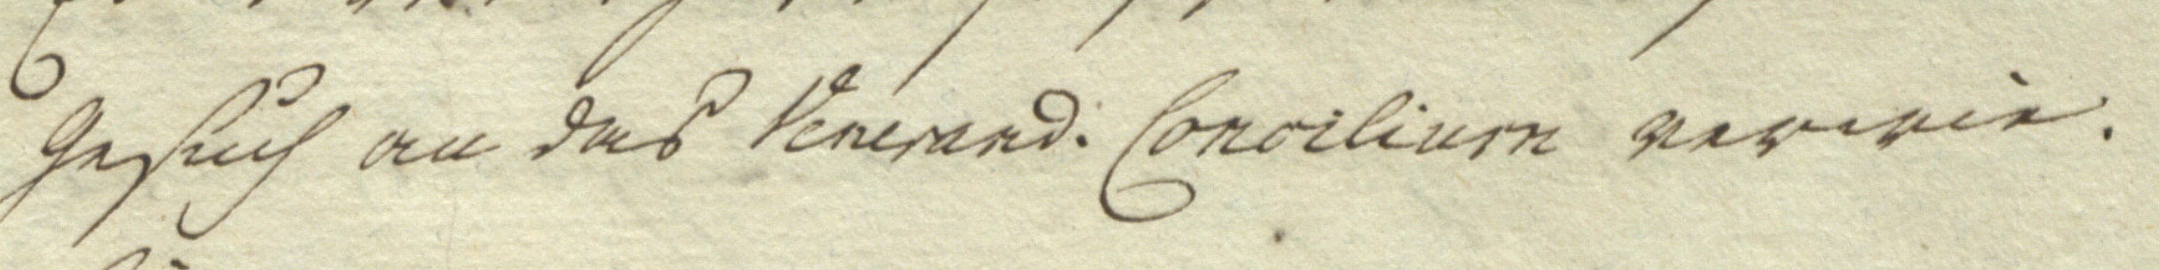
Gesuch an das Venerand: Concilium verwie¬
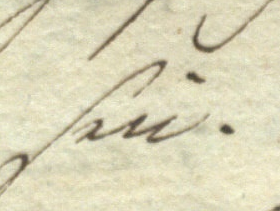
sen.
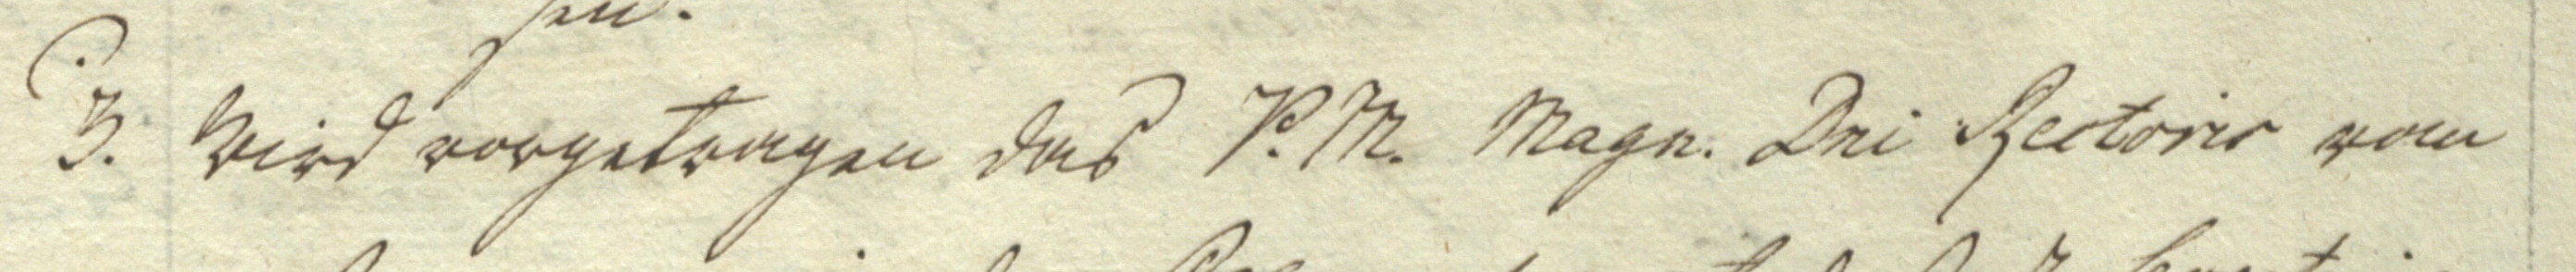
3. Wird vorgetragen das P. M. Magn. Dni Rectoris vom
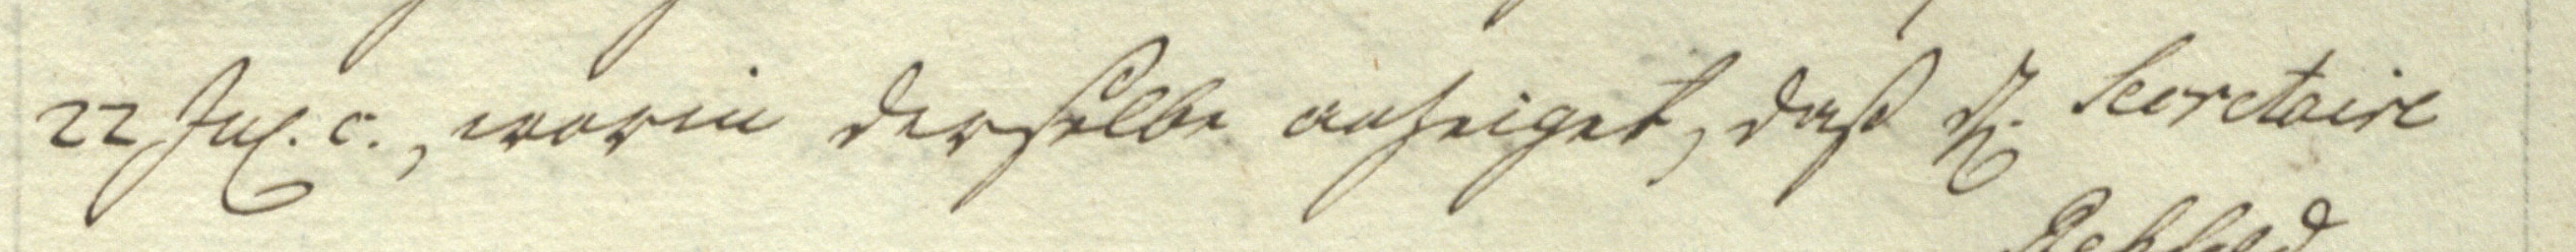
22 Jul. c., worin derselbe anzeiget, daß dh. Secretaire
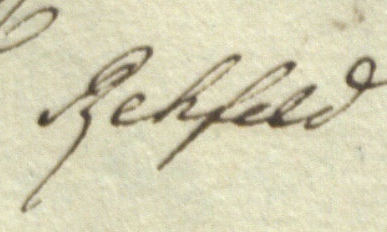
Rehfeld
